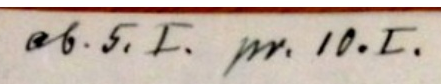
ab 5. I. pr. 10. I.
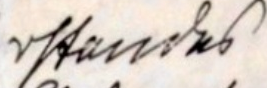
rstandes
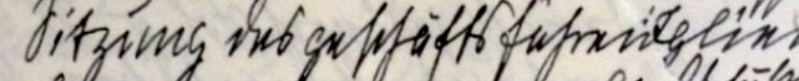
Sitzung des geschäftsführen
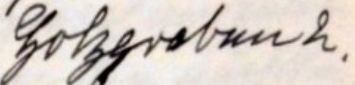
Holzgraben 2
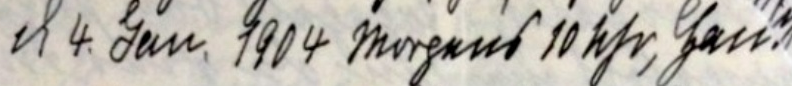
4. Jan. 1904 Morgens 10 Uhr
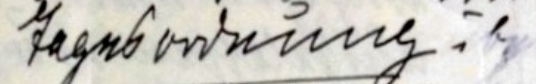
Tagesordnung
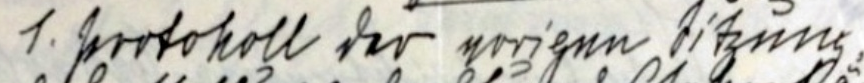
1. Protokoll der vorigen Sitzung
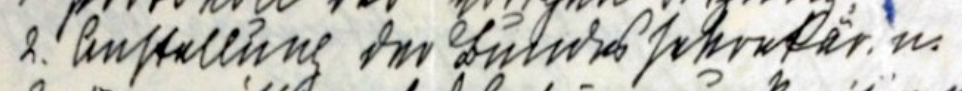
2. Anstellung der Bundessekretärn
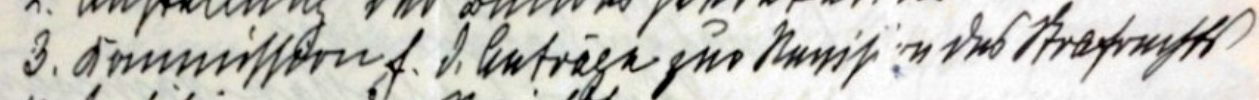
3. Kommision f. d. Anträge zur Revisn des Strafrechts
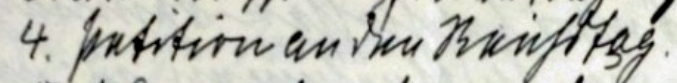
4. Petition and den Reichstag
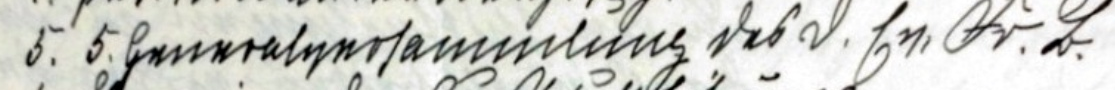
5. 5. Generalversammlung des D. Ev. Fr. B.
